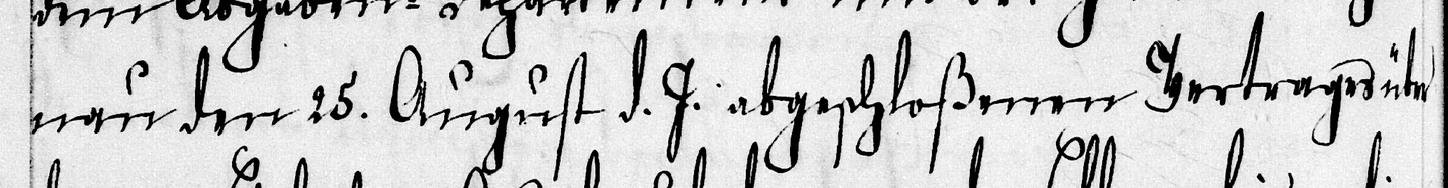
nau den 25. August d. J. abgeschloßenen Vertrages
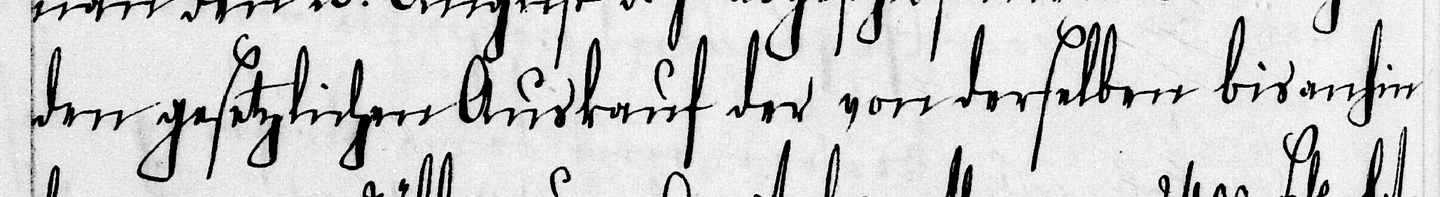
den gesetzlichen Auskauf der von derselben bis anhin
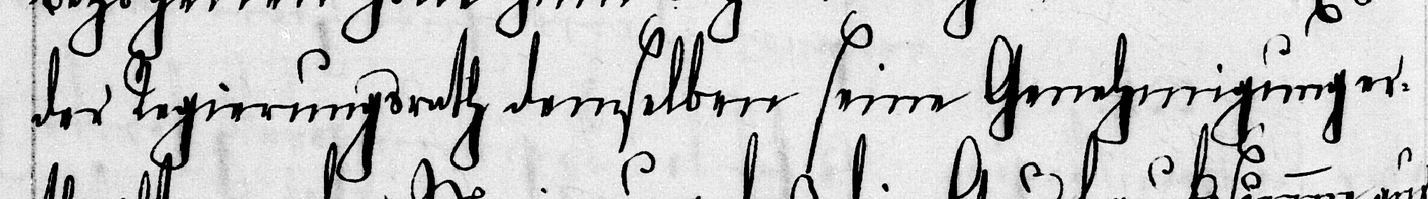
der Regierungsrath demselben seine Genehmigung er¬
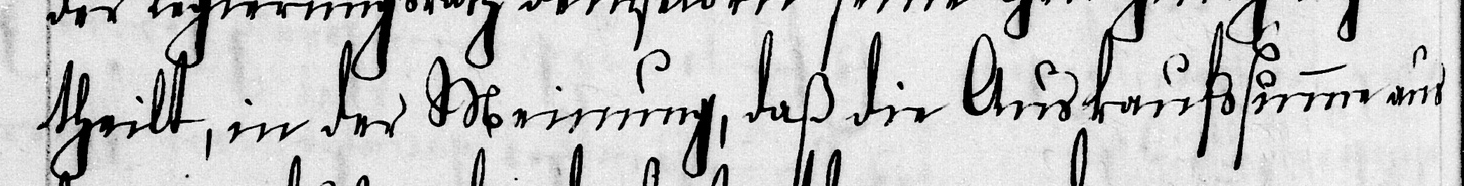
theilt, in der Meinung, daß die Auskaufssumme aus
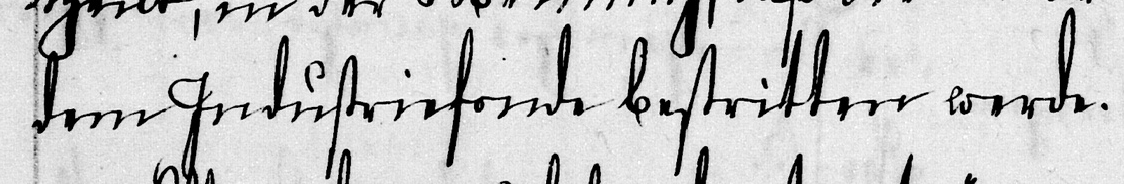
dem Industriefonde bestritten werde.
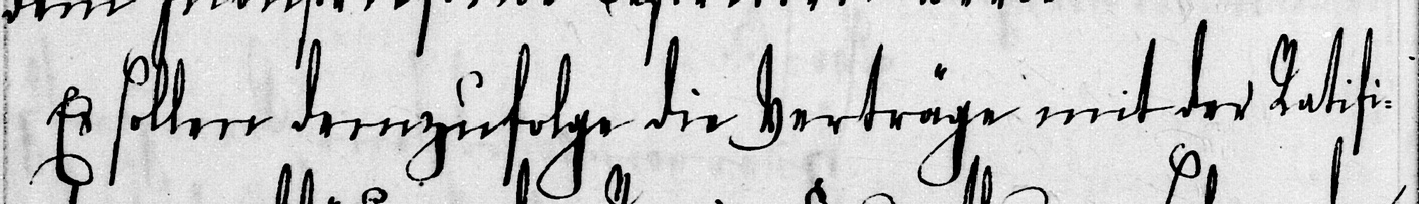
Es sollen demzufolge die Verträge mit der Ratif¬
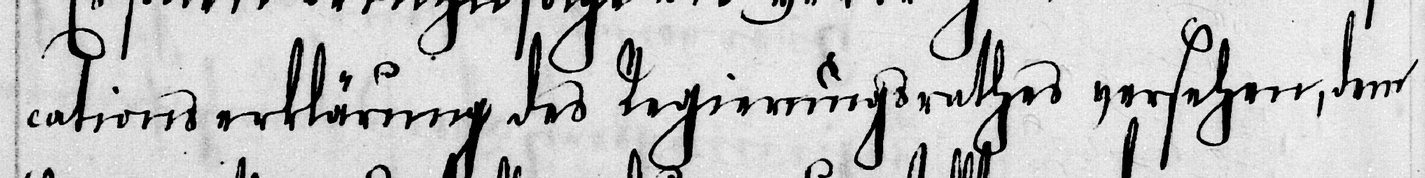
icationserklärung des Regierungsrathes versehen, dem
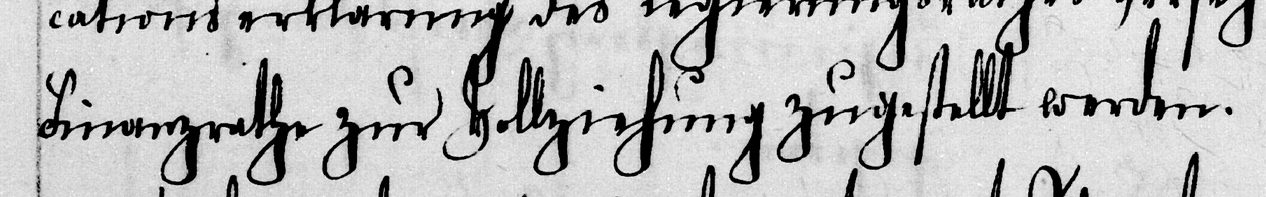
Finanzrathe zur Vollziehung zugestellt werden.
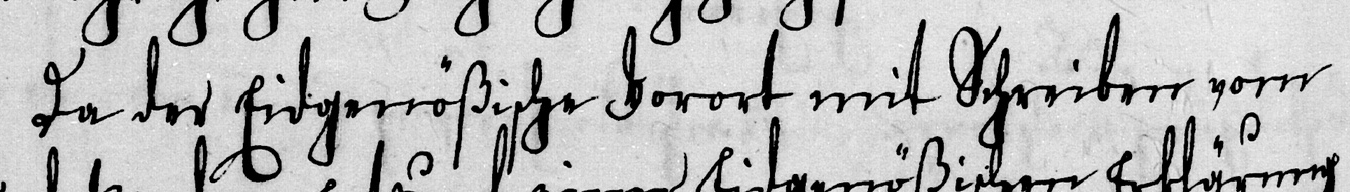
Da der Eidgenößische Vorort mit Schreiben vom
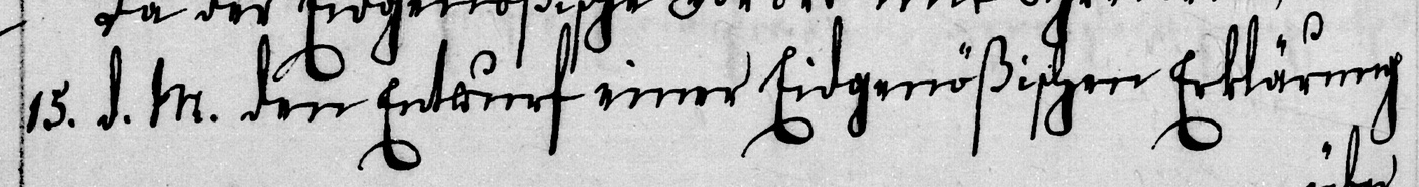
15. d. M. dem Entwurf einer Eidgenößischen Erklärung
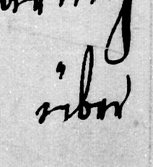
über
